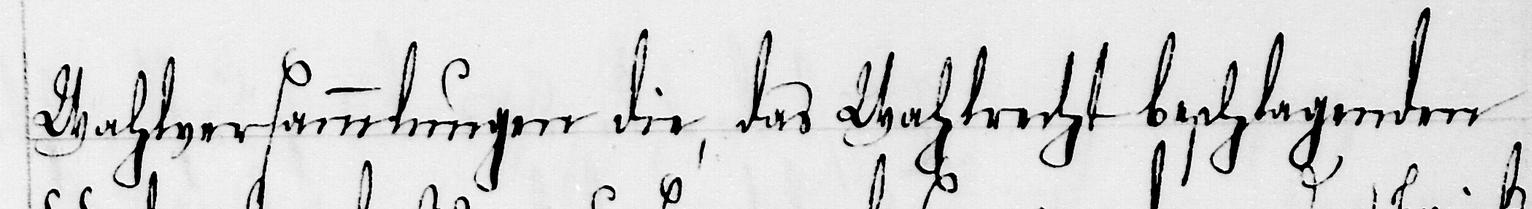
Wahlversammlungen die, das Wahlrecht beschlagenden
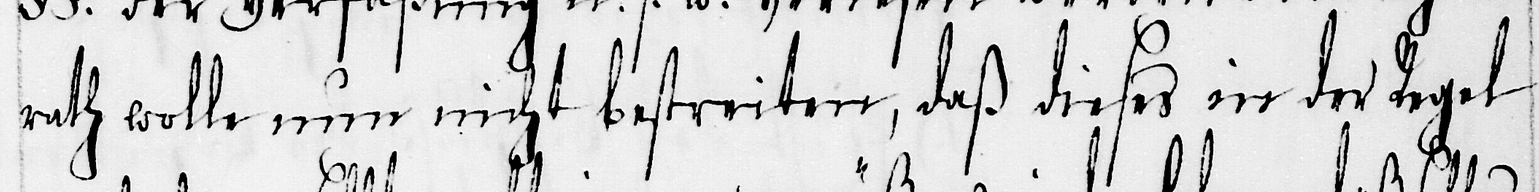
rath wolle nun nicht bestreiten, daß dieses in der Regel
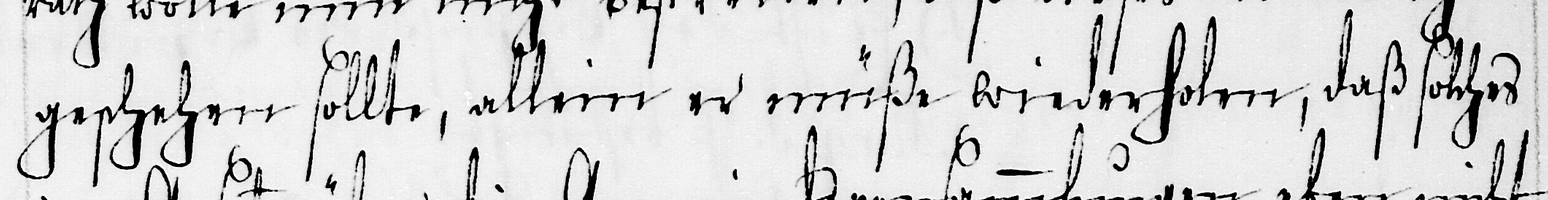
geschehen sollte, allein er müße wiederholen, daß solches
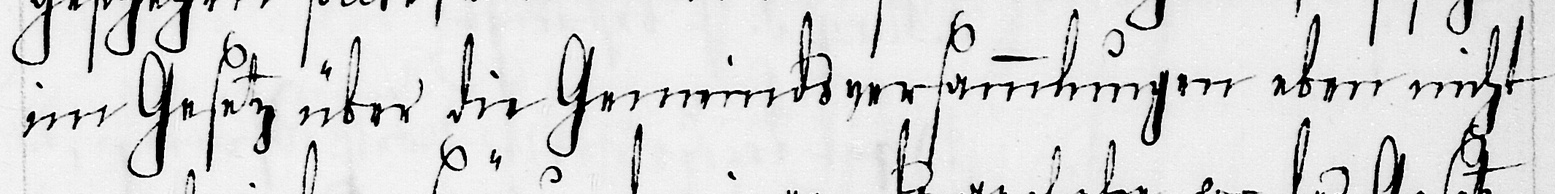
im Gesetz über die Gemeindsversammlungen eben nicht
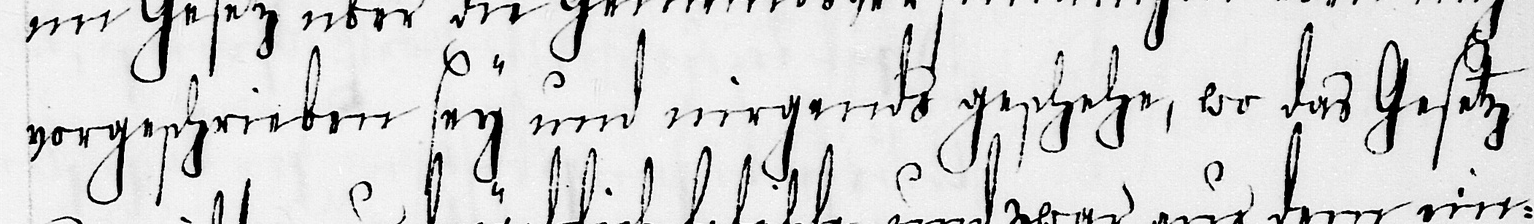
vorgeschrieben sey und nirgends geschehe, wo das Gesetz
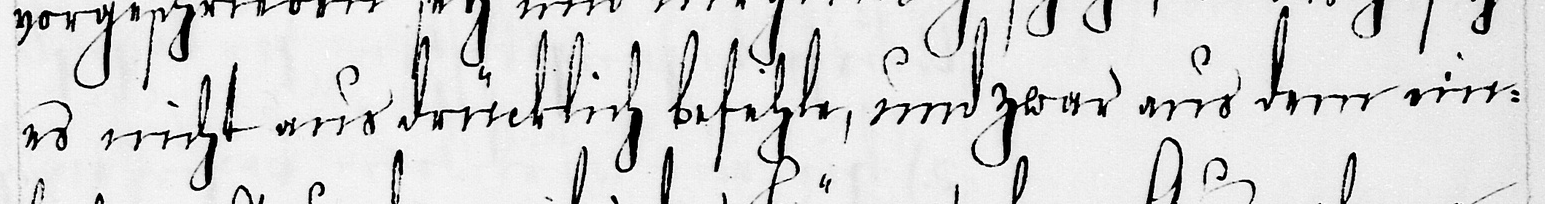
es nicht ausdrücklich befehle, und zwar aus dem ein¬
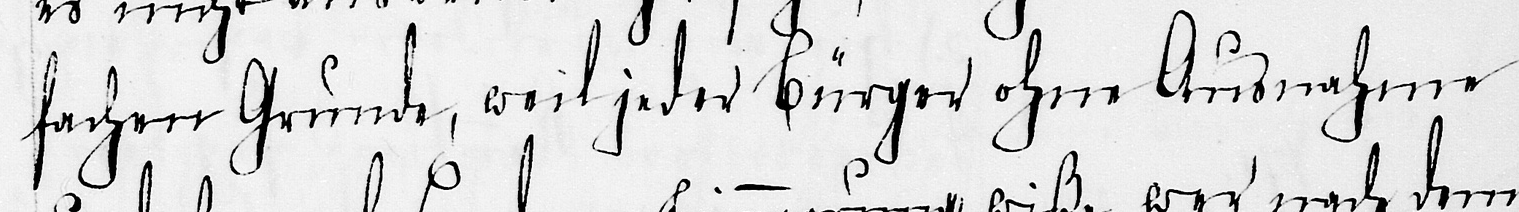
fachen Grunde, weil jeder Bürger ohne Ausnahme
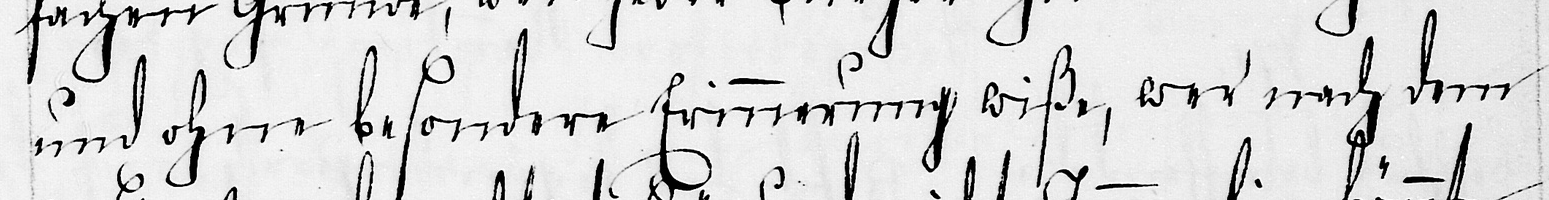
und ohne besondere Erinnerung wiße, wer nach dem
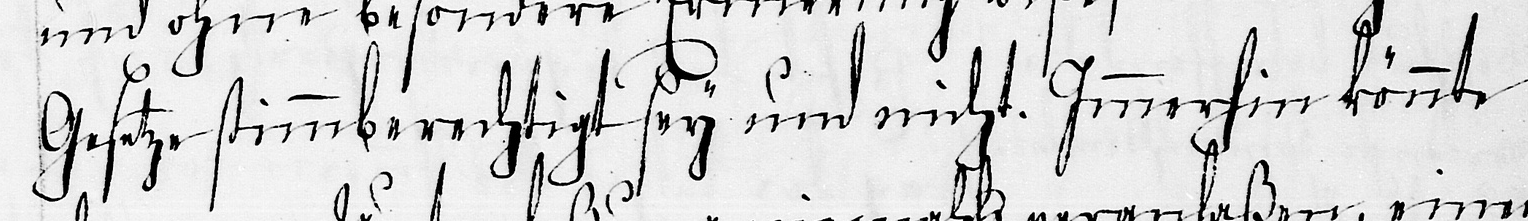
Gesetze stimmberechtigt sey und nicht. Immerhin könnte
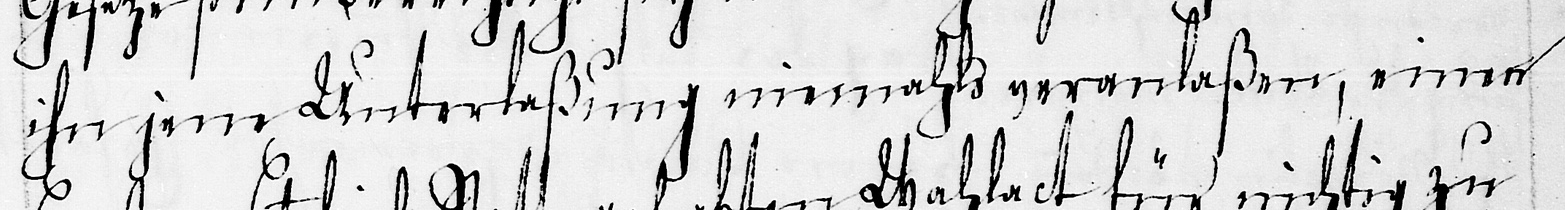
ihn jene Unterlaßung niemahls veranlaßen, einen
